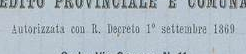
Autorizzata con R. Decreto 1o settembre 1869
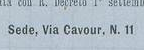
Sede, Via Cavour, N. 11
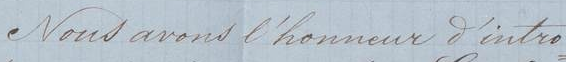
Nous avons l'honneur d'intro-
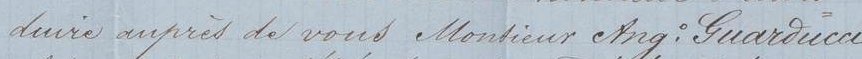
duire auprès de vous Monsieur Ang: Guarducci
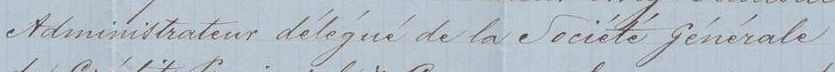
Administrateur délégué de la Société Générale
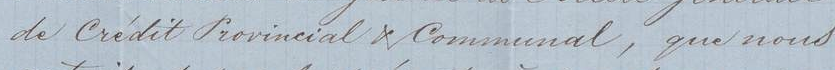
de Crédit Provincial & Communal, que nous
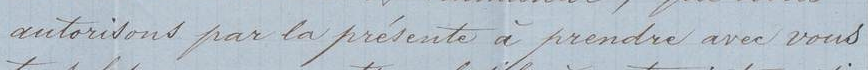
autorisons par la présente à prendre avec vous
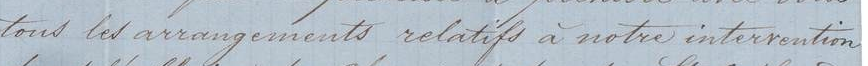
tous les arrangements relatifs à notre intervention
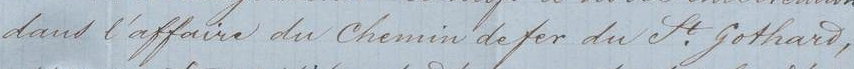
dans l'affaire du Chemin de fer du St Gothard,
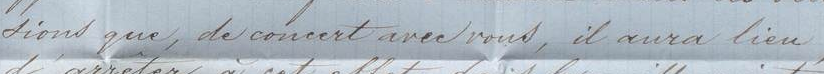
sions que, de concert avec vous, il aura lieu
